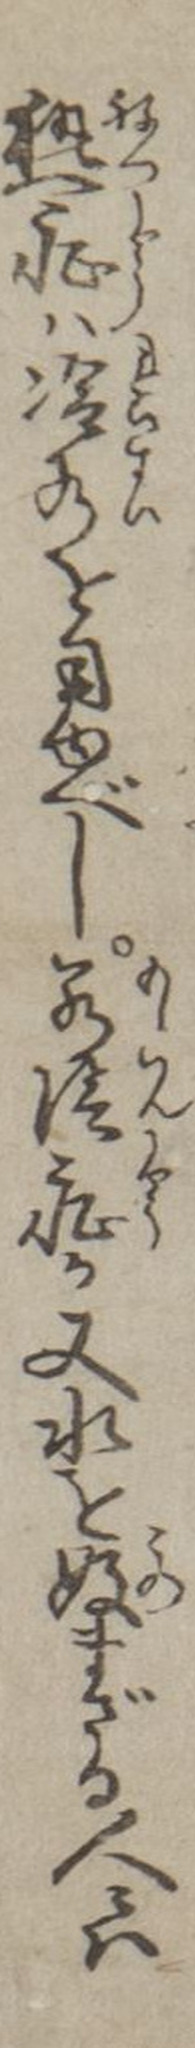熱症は冷水を用ゆべし。若陰症か又水を好まざる人には
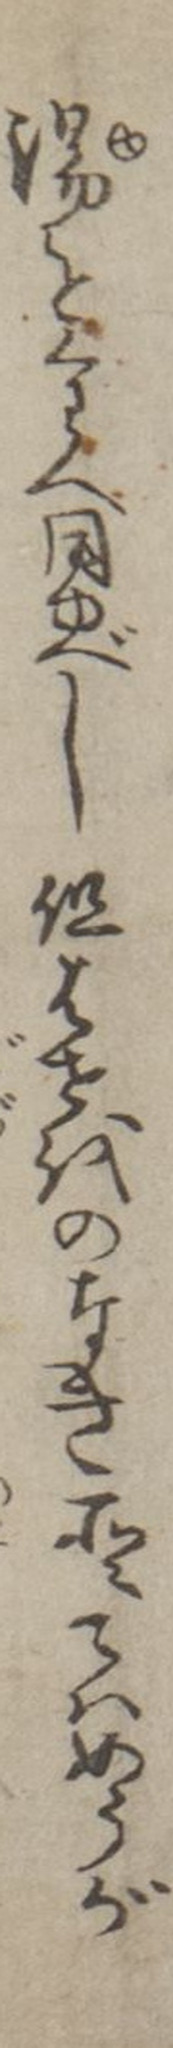湯をくわへ用ゆべし但はせをのなき所にてはめうが
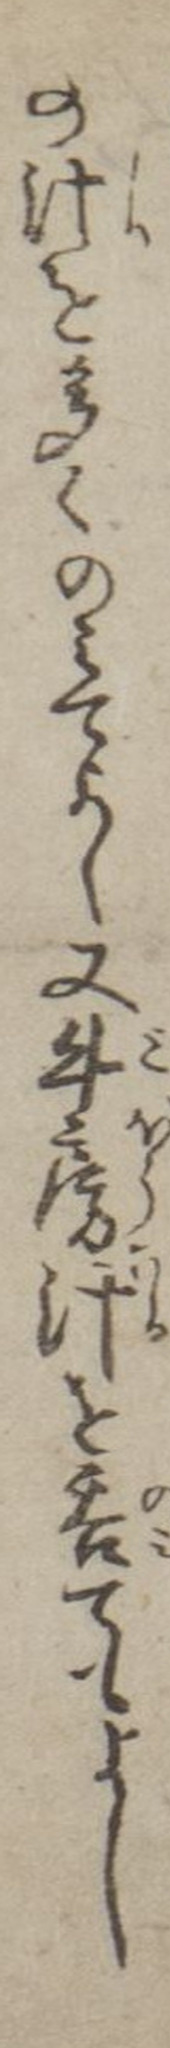の汁を多くのみてよし又牛房汁を呑てもよし
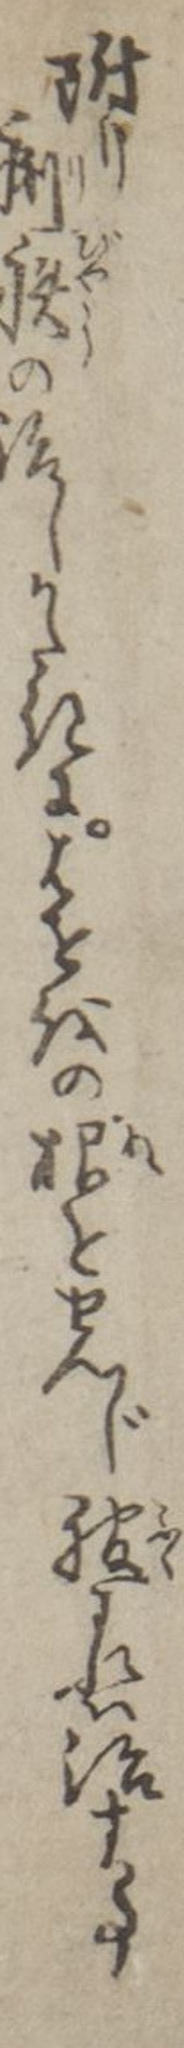痢疾の治しかたきに。はせをの根をせんじ服すれは治する事
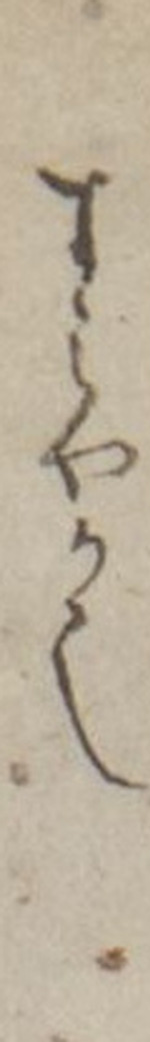すみやか也
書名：疫癘速かに治する妙薬法
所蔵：あいおいニッセイ同和損保株式会社
